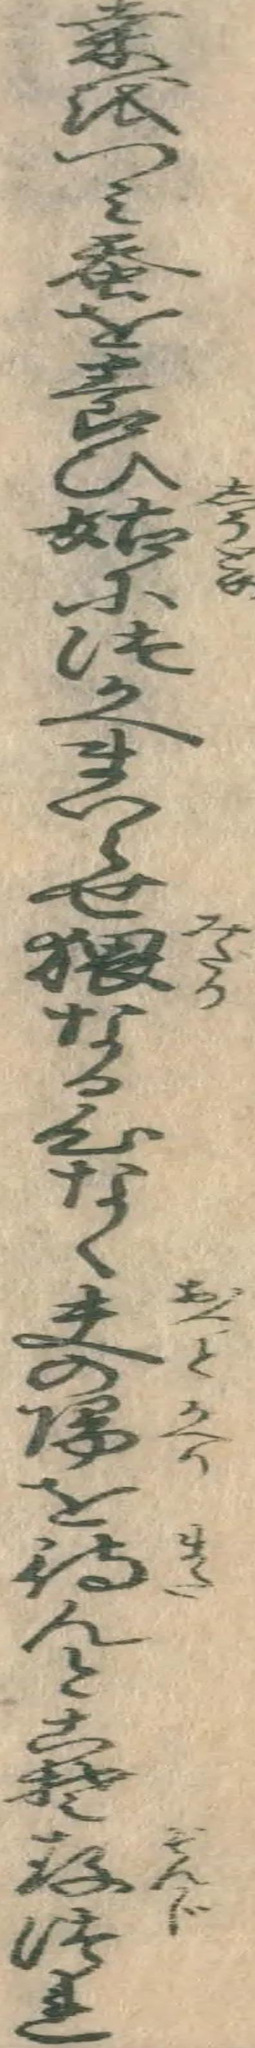桑をつみ蚕を養ひ姑につかへまいらせ猥なる心なく夫の帰を待んとこそ存つれ
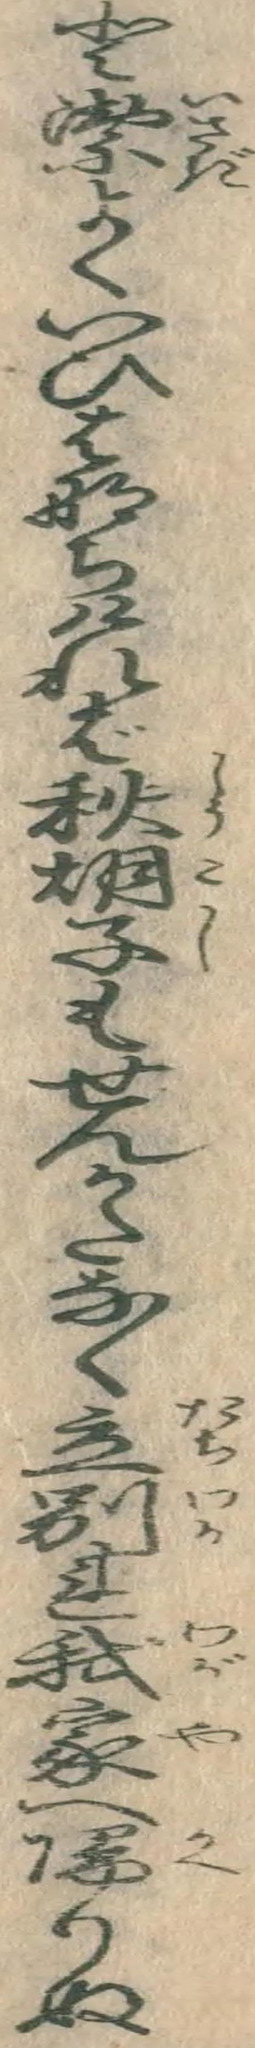と潔よくいひはなちければ秋胡子もせんかたなく立別れ我家へ帰りぬ
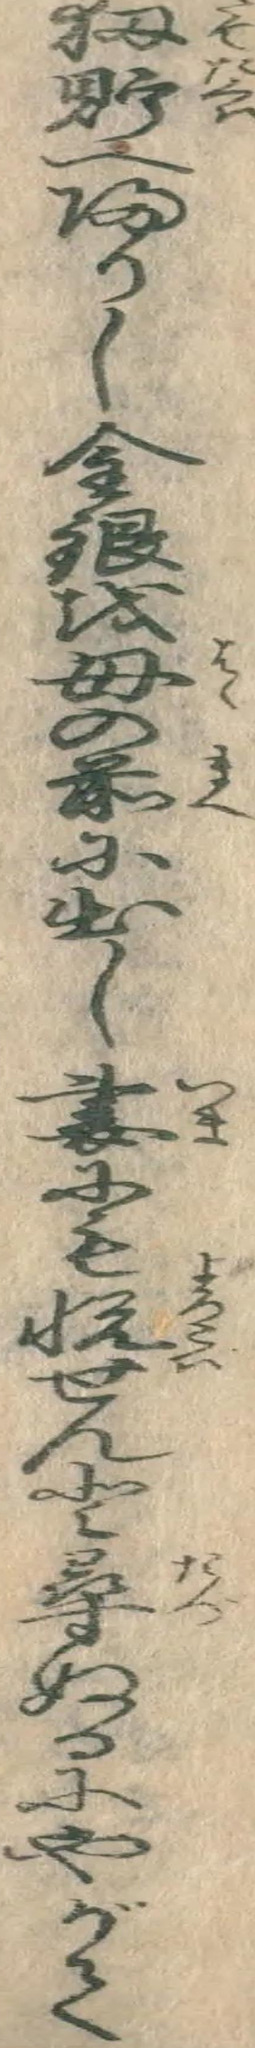扨貯へ帰りし金銀を母の前に出し妻にも悦せんと尋ぬるにやがて
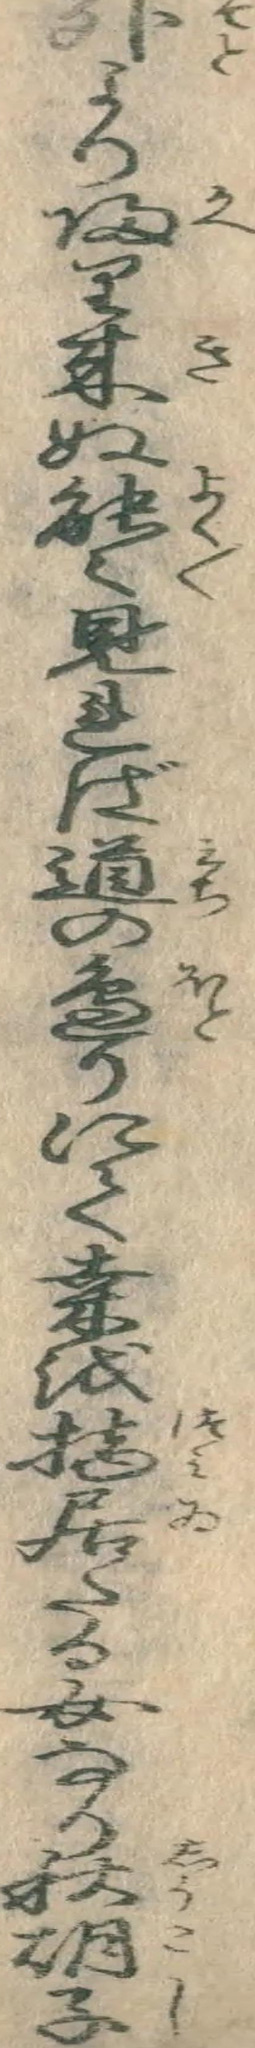外より帰り来ぬ能々見れば道の辺りにて桑を摘居たる女なり秋胡子
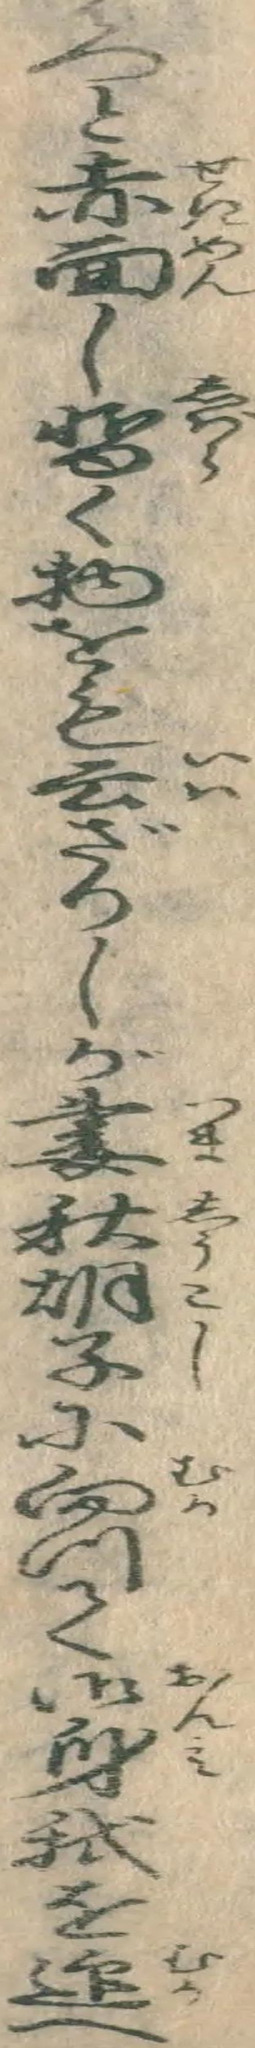はつと赤面し暫く物をも云ざりしが妻秋胡子に向つて御身我を迎へ
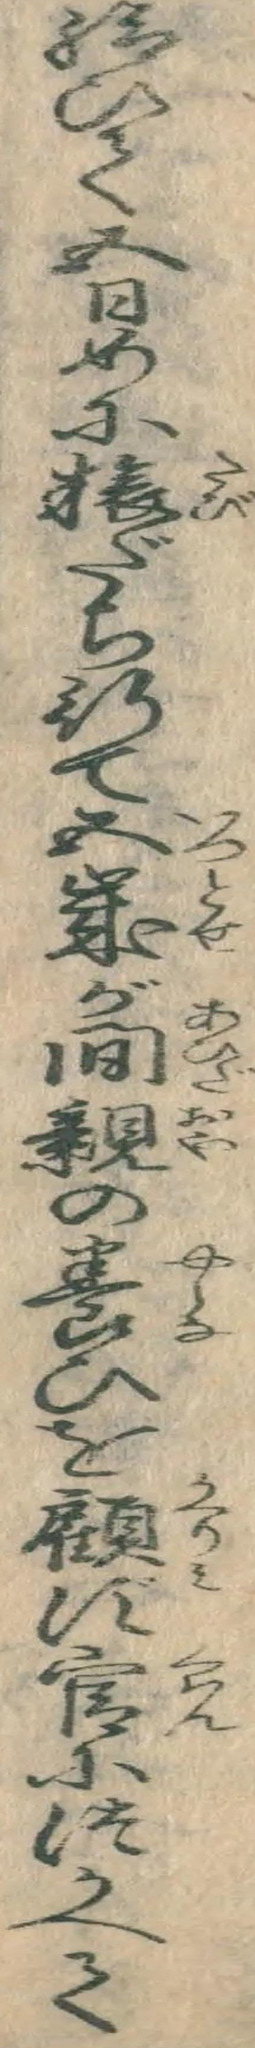給ひて五日めに旅だち行て五歳が間親の養ひを顧ず官につかへて

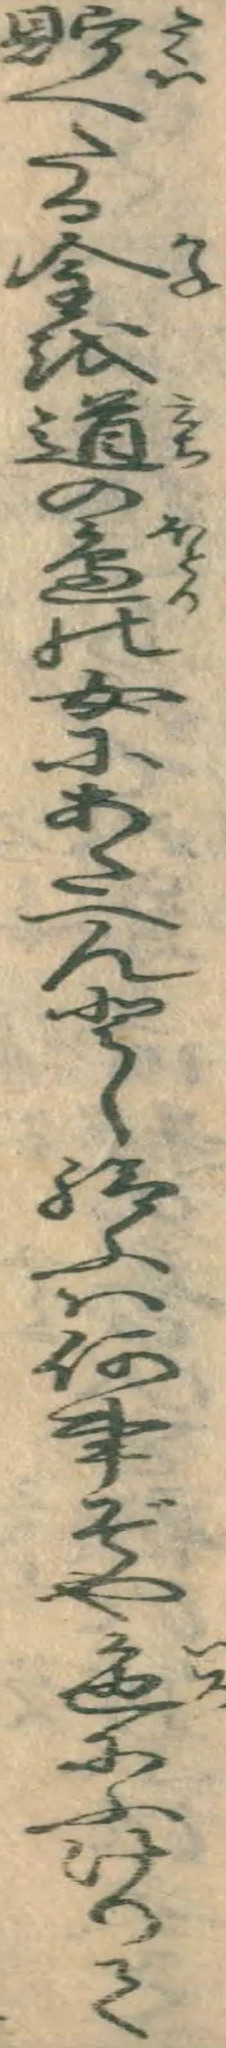貯へたる金を道の辺の女にあたへんとし給ふは何事ぞや色にふけりて
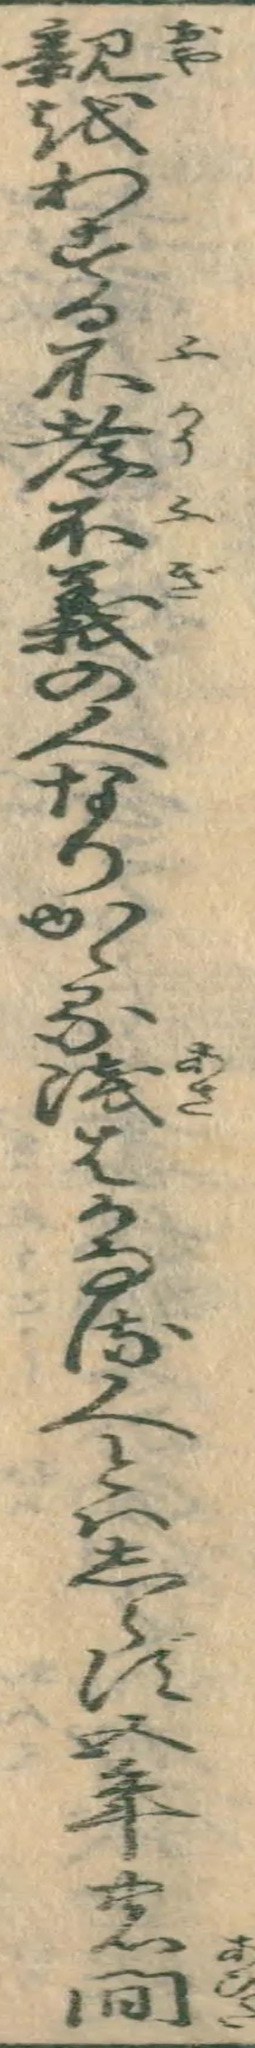親をわする不孝不義の人なりかゝる浅はかなる人とはしらず五年の間
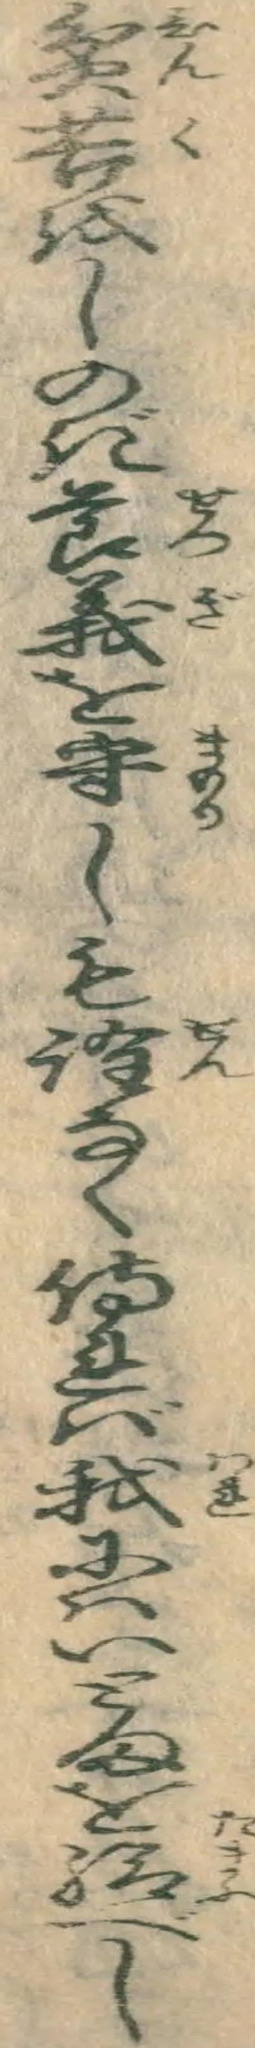貧苦をしのぎ節義を守しも詮なく侍れば我にはいとまを給べし
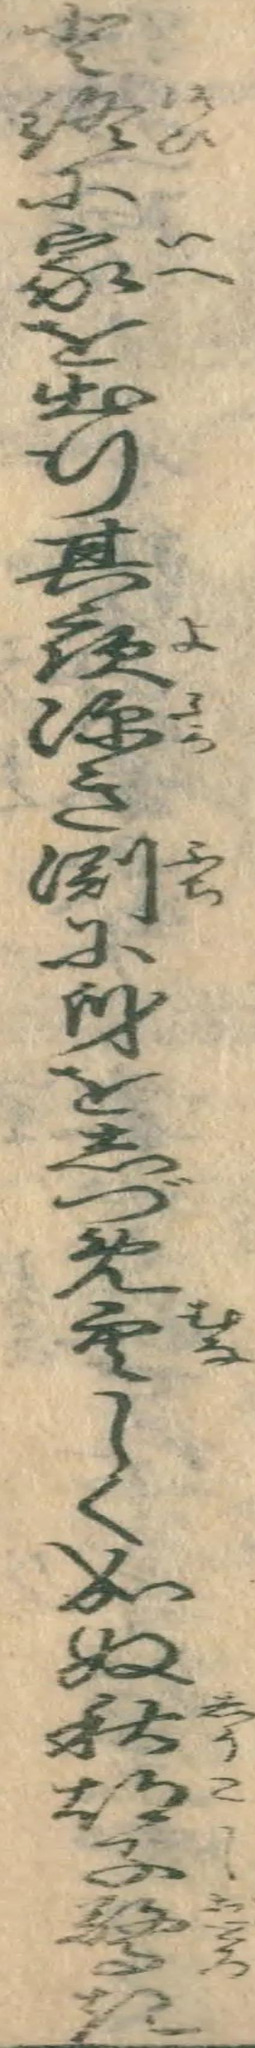と終に家を出行其夜深き淵に身をしづめ空しく成ぬ秋胡子驚き
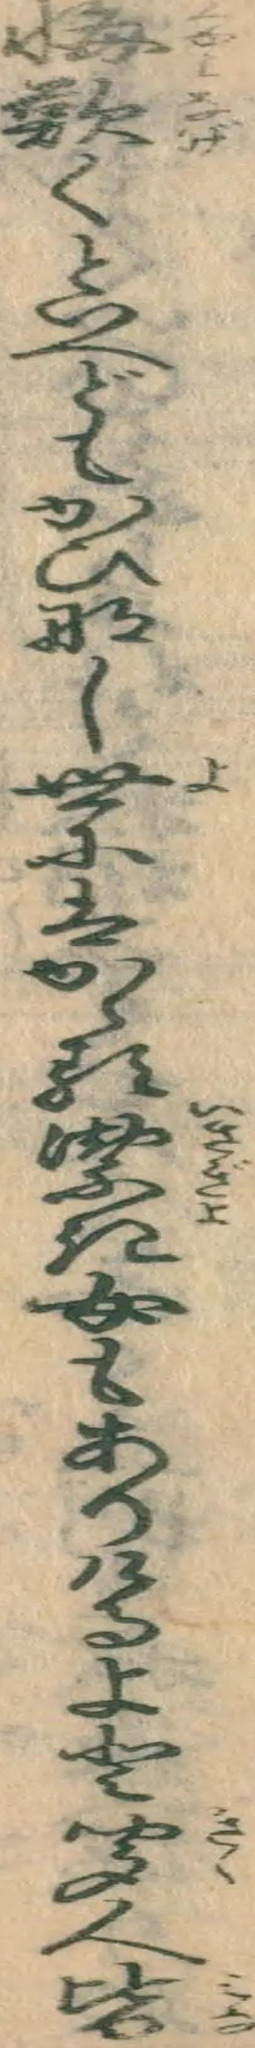悔歎くといへどもかひなし世にはかゝる潔き女もありけるよと聞人皆
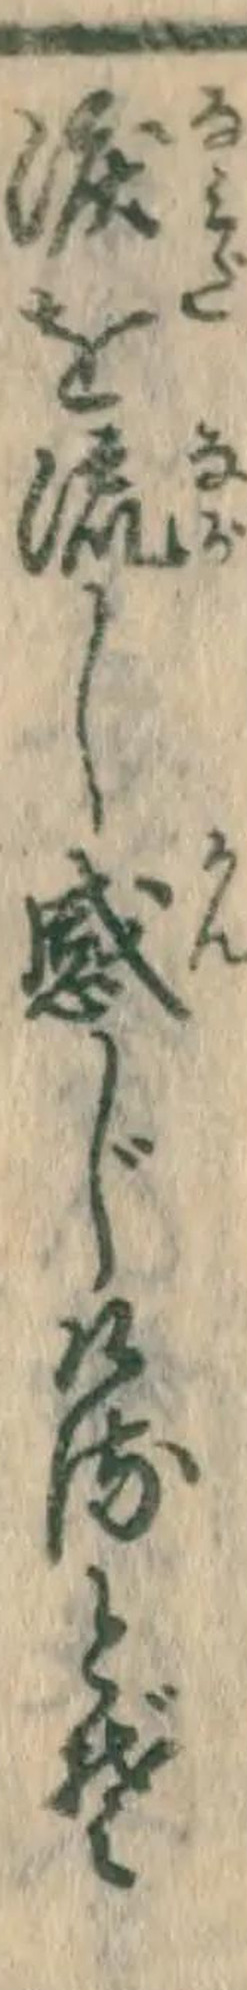涙を流し感じけるとぞ
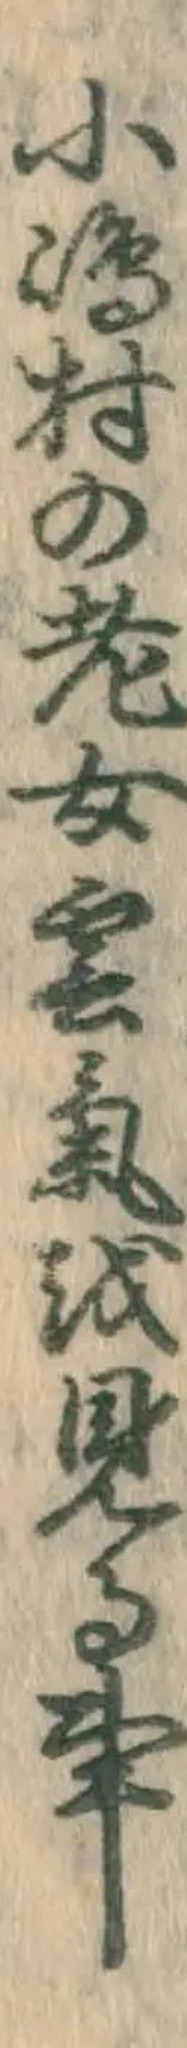小嶋村の老女雲気を見る事
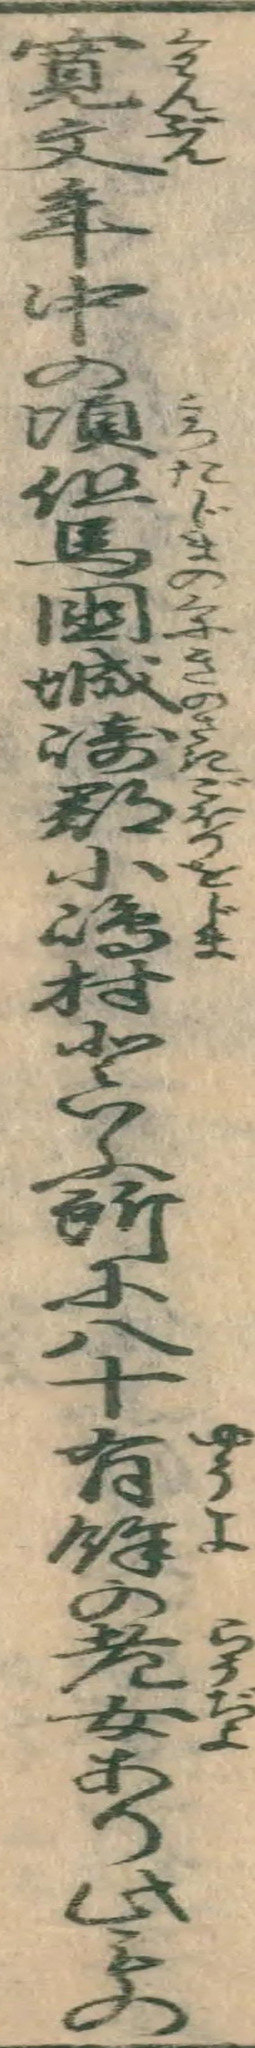寛文年中の頃但馬国城崎郡小嶋村といふ所に八十有余の老女あり此もの
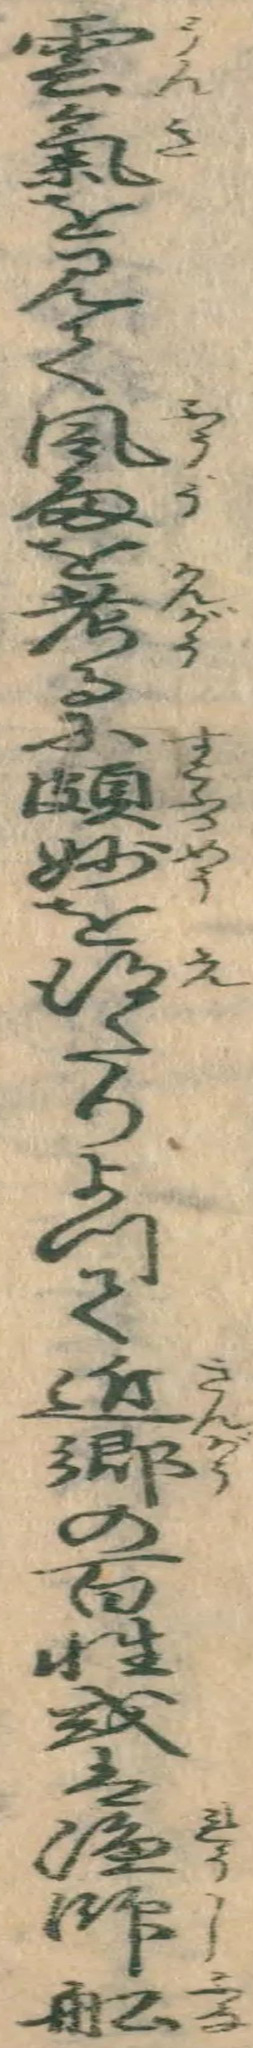雲気を見て風雨を考るに頗妙を得たりよつて近郷の百性或は漁師船
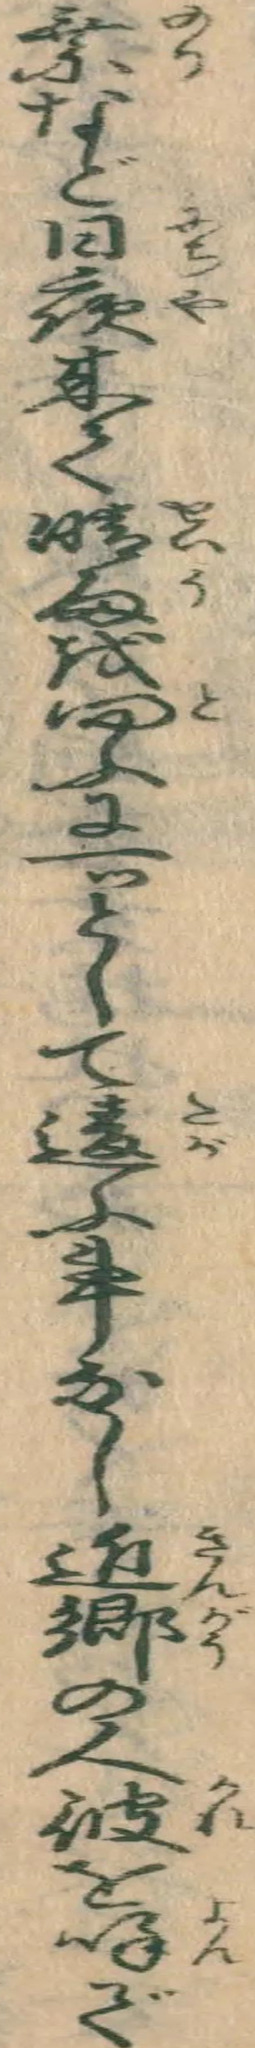乗など日夜来て晴雨を問ふに一ツとして違ふ事なし近郷の人彼を呼で
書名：養蚕秘録 3巻. [3]
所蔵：国立国会図書館 National Diet Library, JAPAN
